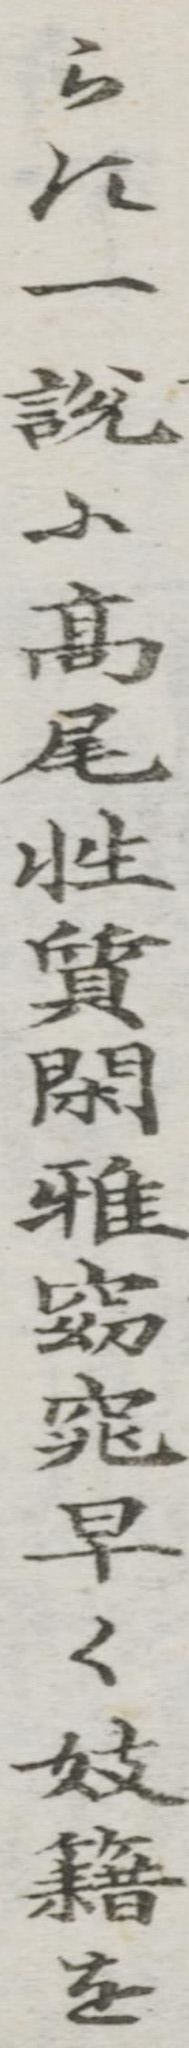らす一説に高尾性質閑雅窈窕早く妓籍を
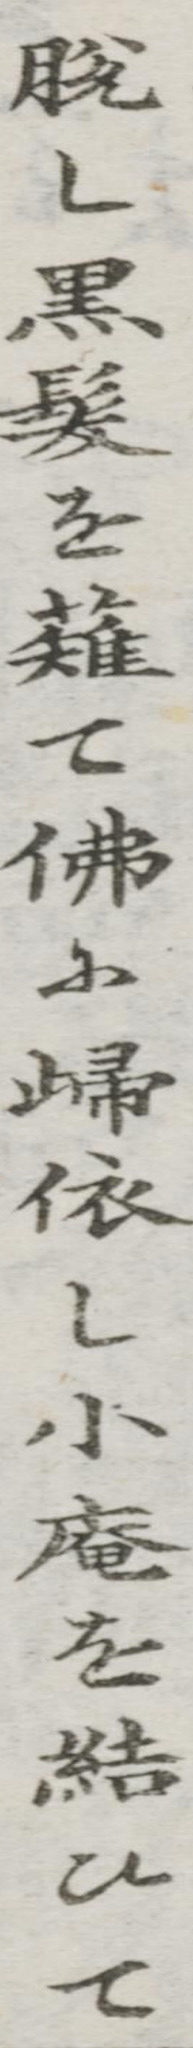脱し黒髪を薙て仏に帰依し小庵を結ひて
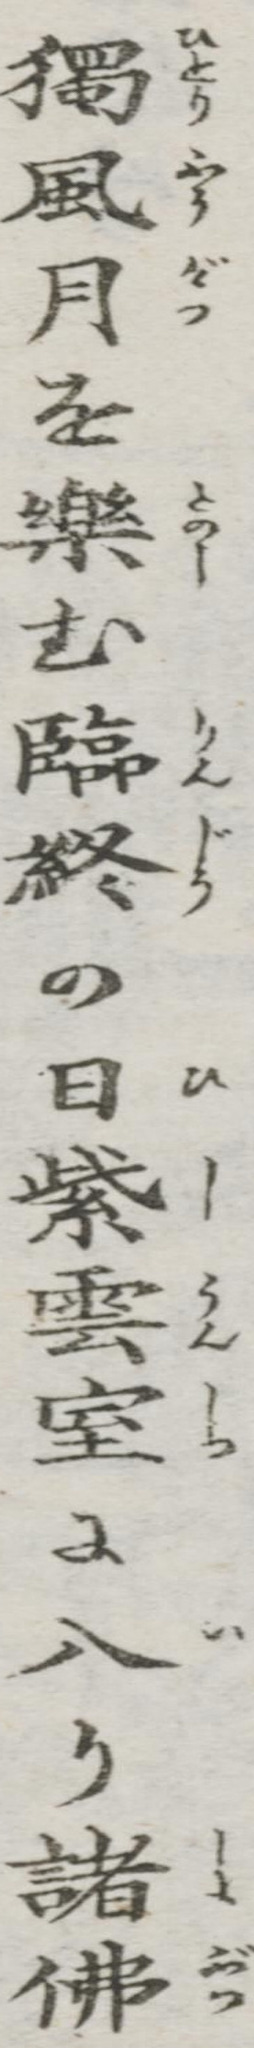独風月を楽む臨終の日紫雲室に入り諸仏
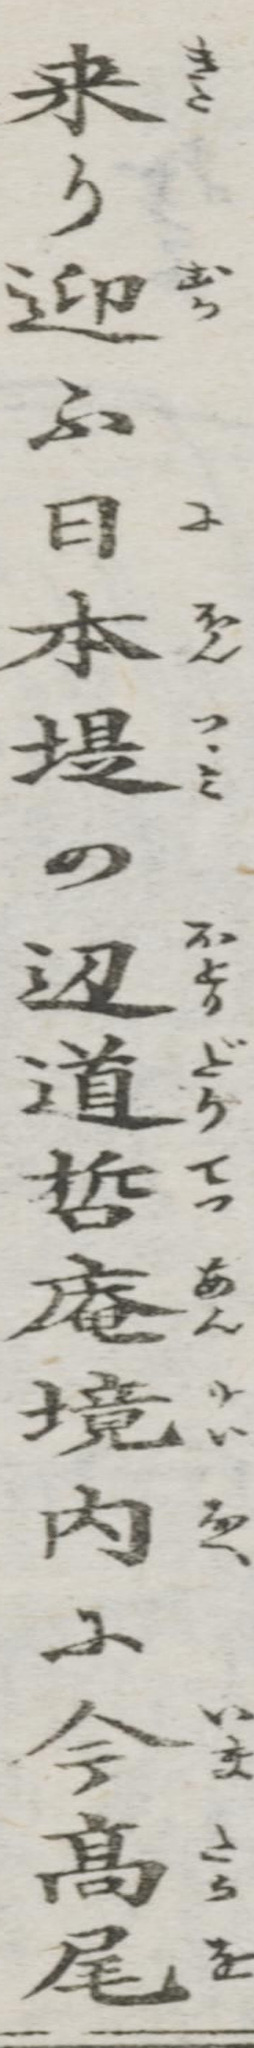来り迎ふ日本堤の辺道哲庵境内に今高尾
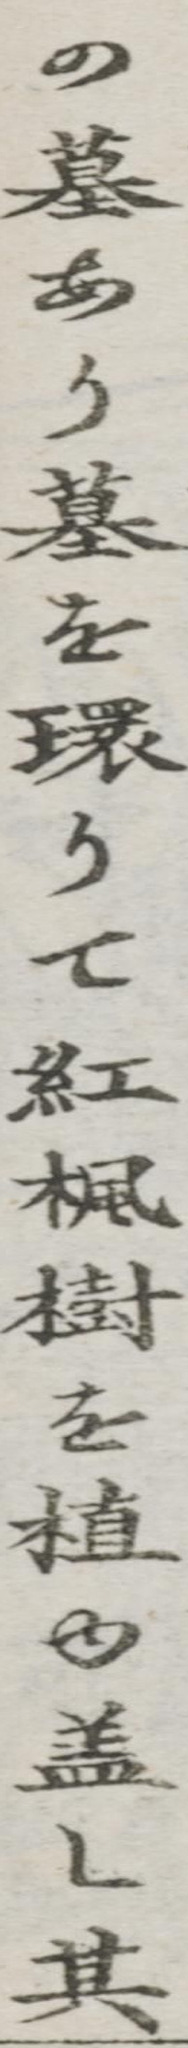の墓あり墓を環りて紅楓樹を植ゆ蓋し其
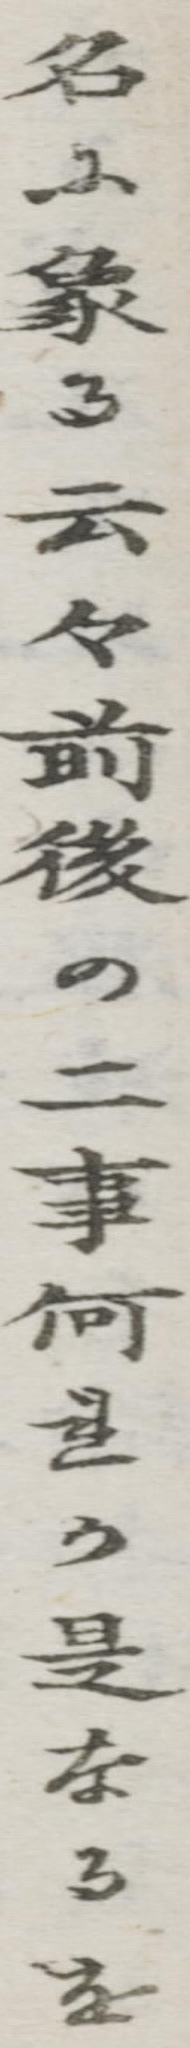名に象る云々前後の二事何れか是なるを
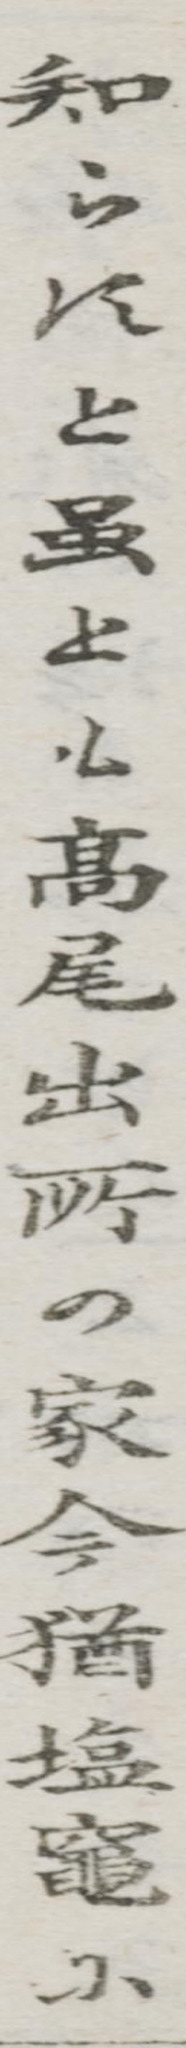知らすと雖とも高尾出所の家今猶塩竈に
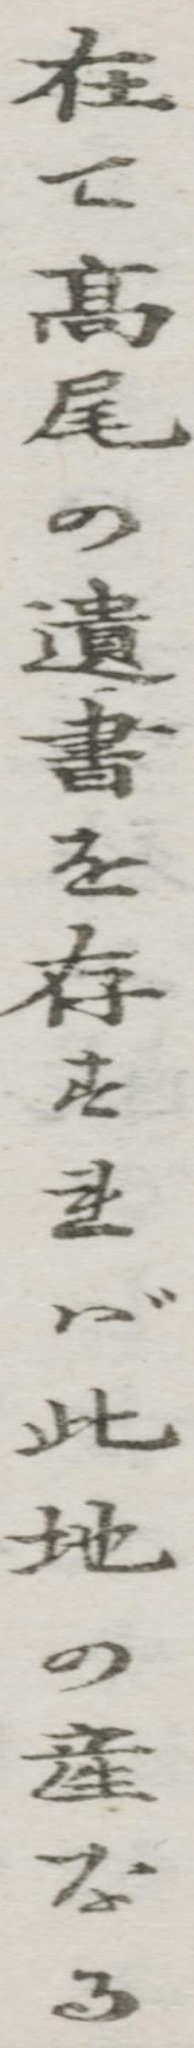在て高尾の遺書を存すれば此地の産なる
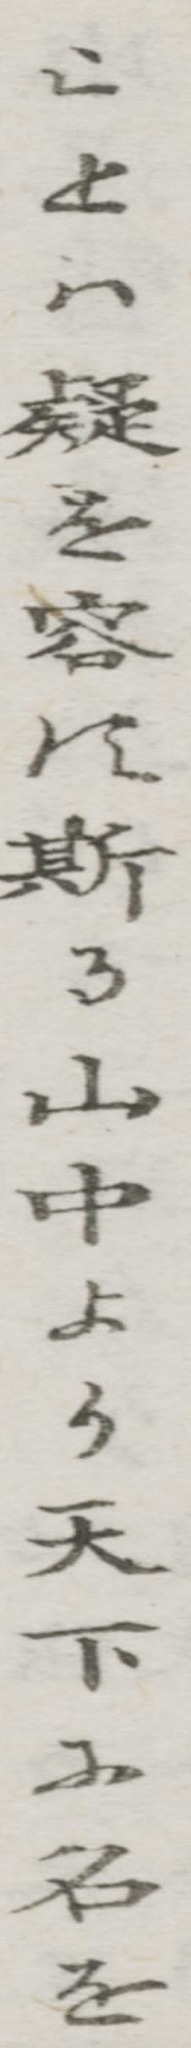ことは疑を容す斯る山中より天下に名を
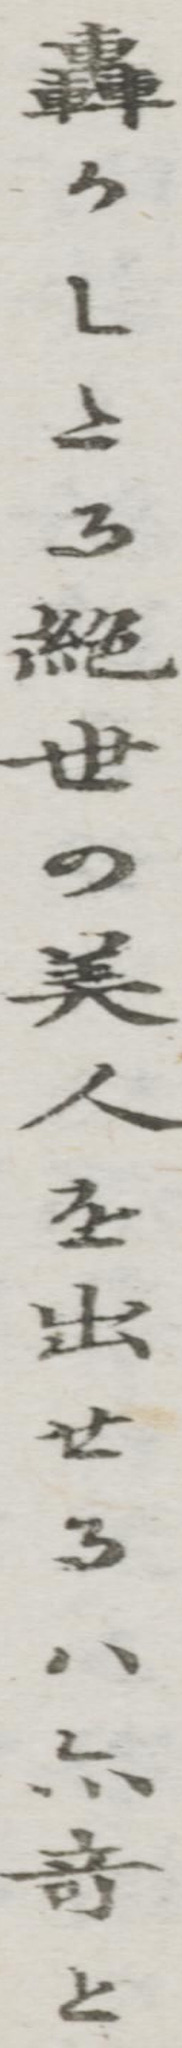轟かしたる絶世の美人を出せるは亦奇と
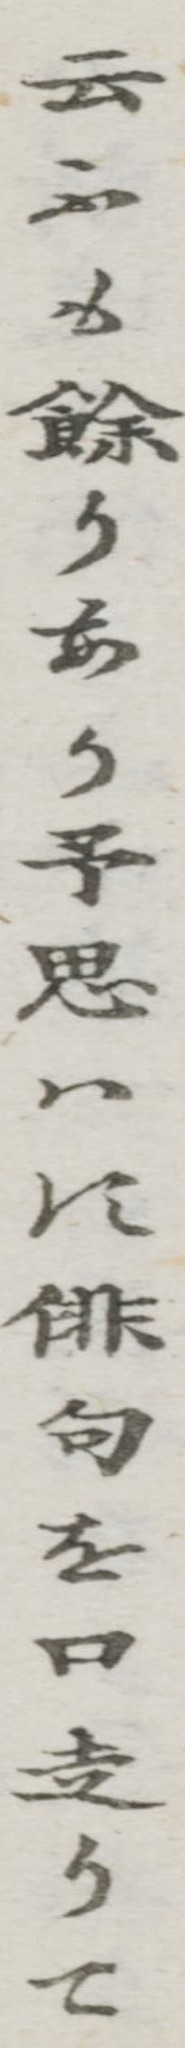云ふも餘りあり予思はす俳句を口走りて
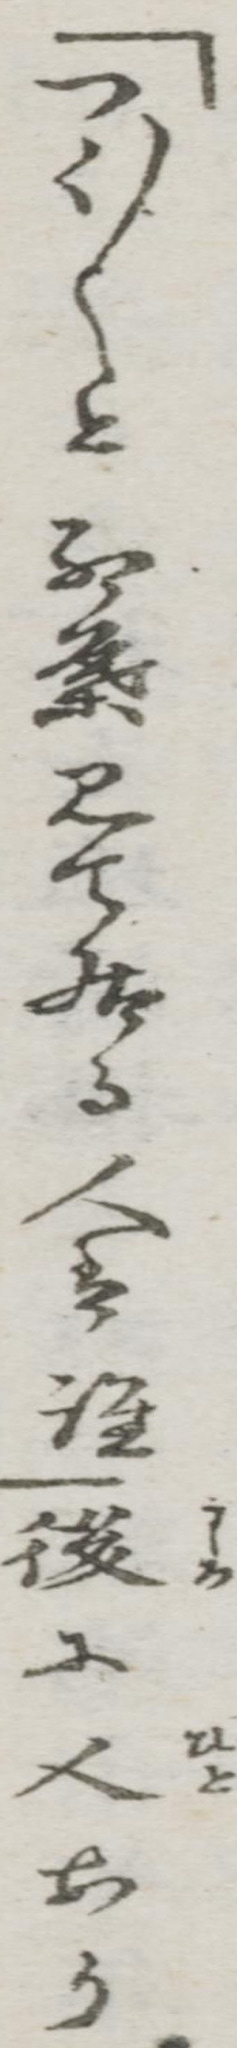「つく〳〵と若葉見て居る人は誰」後に人あり
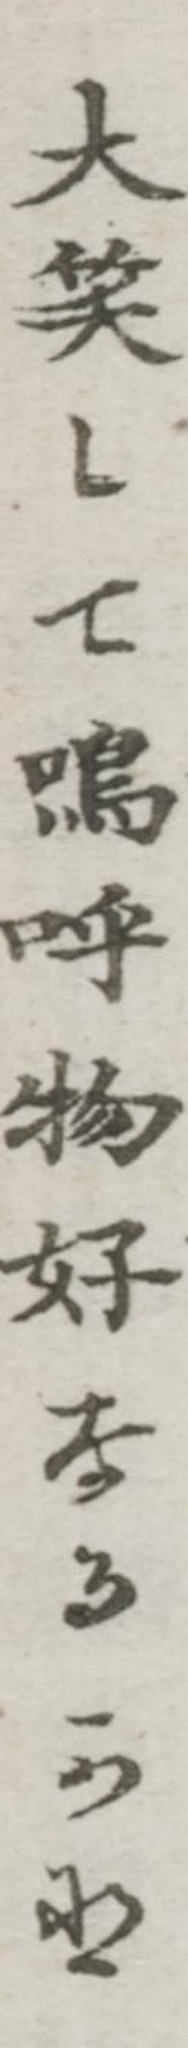大笑して嗚呼物好なるかな

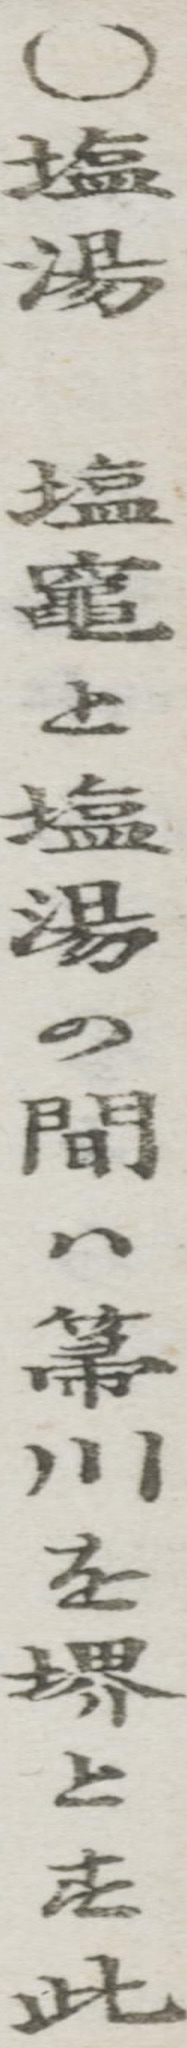○塩湯塩竈と塩湯の間は箒川を堺とす此
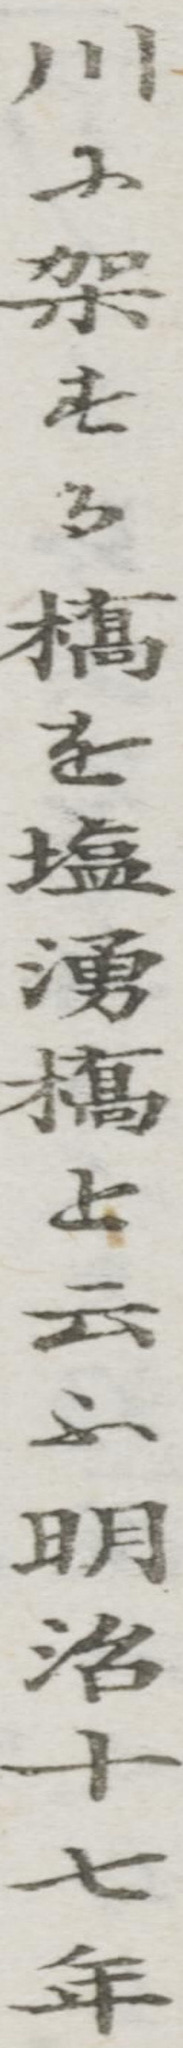川に架する槗を塩湧槗と云ふ明治十七年
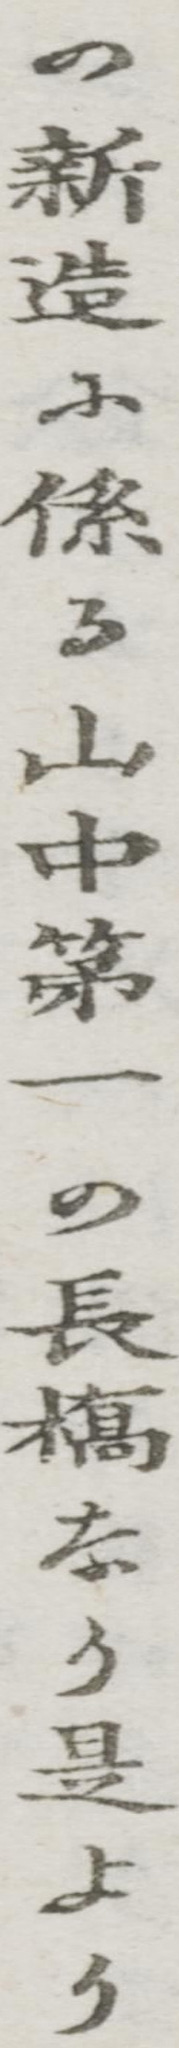の新造に係る山中第一の長槗なり是より
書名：塩原繁昌記　全
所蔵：東京大学地震研究所図書室 Earthquake Research Institute Library, The University of Tokyo, JAPAN
